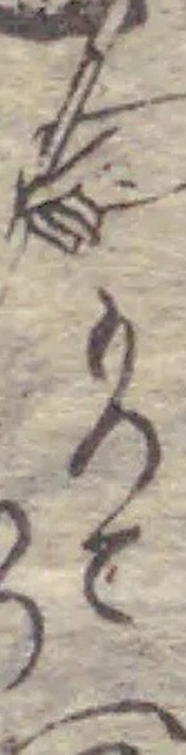もつて
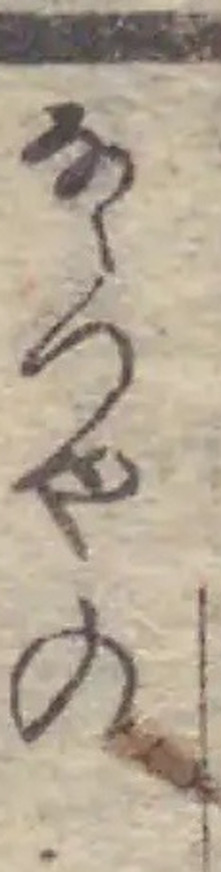ななつやの
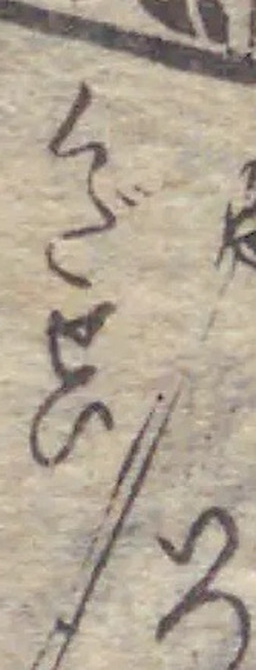くだせい
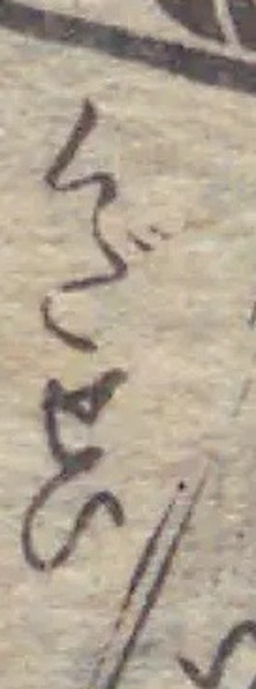くだせい
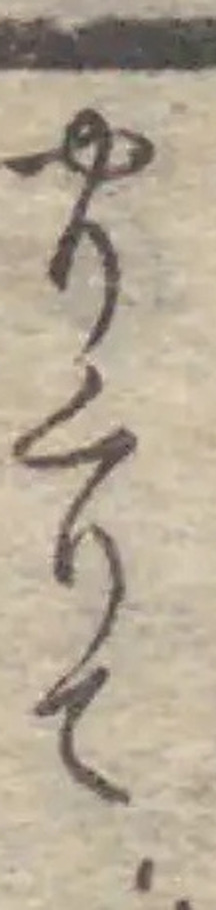やりくりて
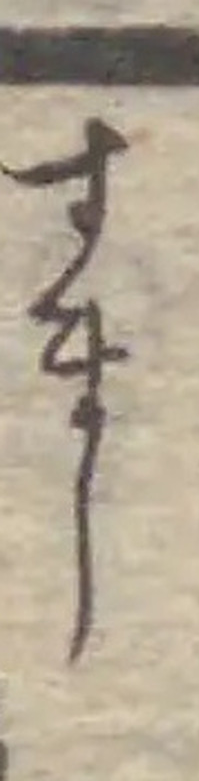すまし

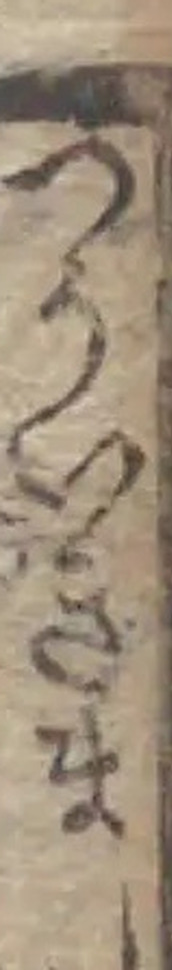つういきま
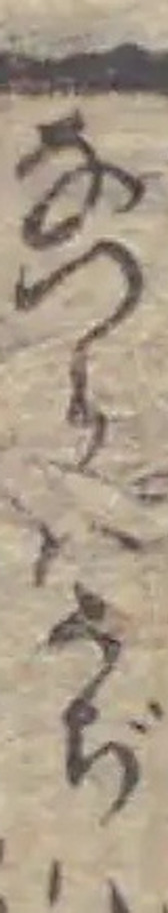なつらはうぢ
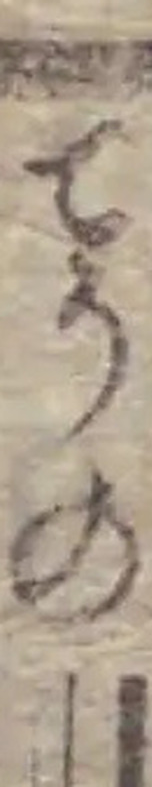てうの
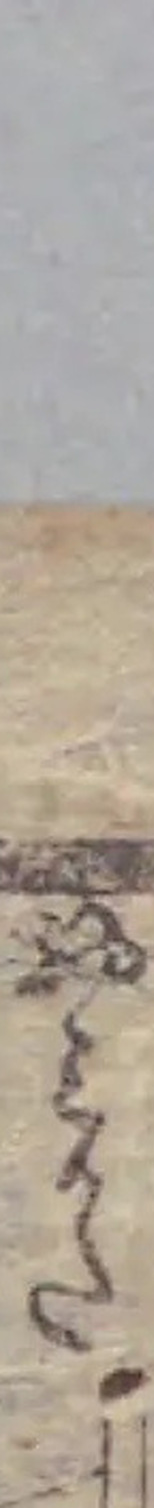おみかた
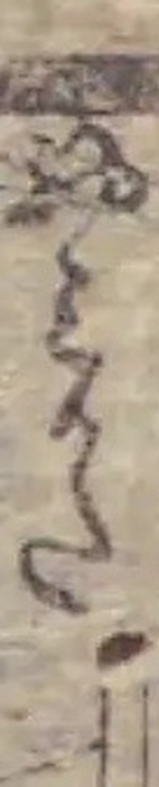おみかた
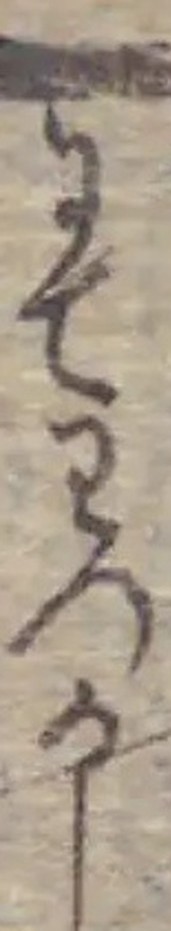にてわつか
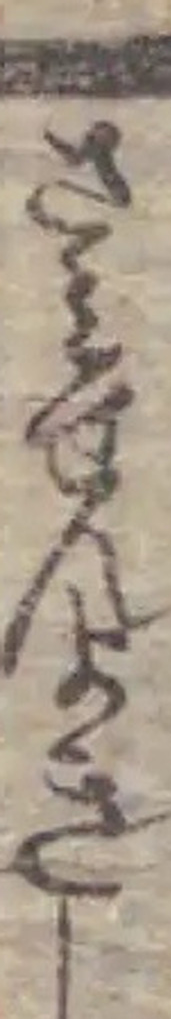さみせんよき
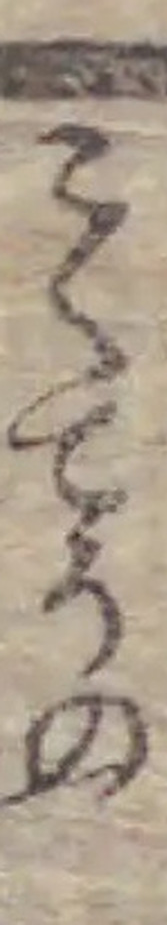こくてうの
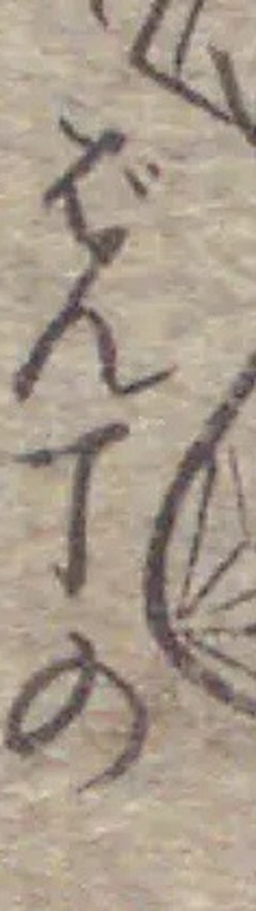ばん丁の
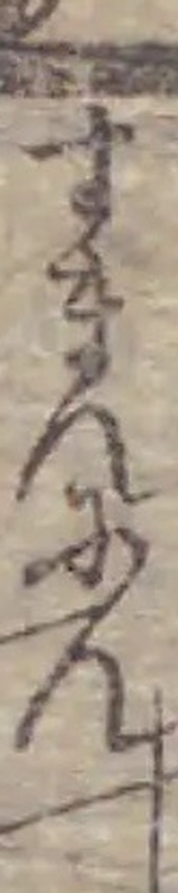すまんにん
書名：かんなんの夢枕 2巻
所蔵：国立国会図書館 National Diet Library, JAPAN
